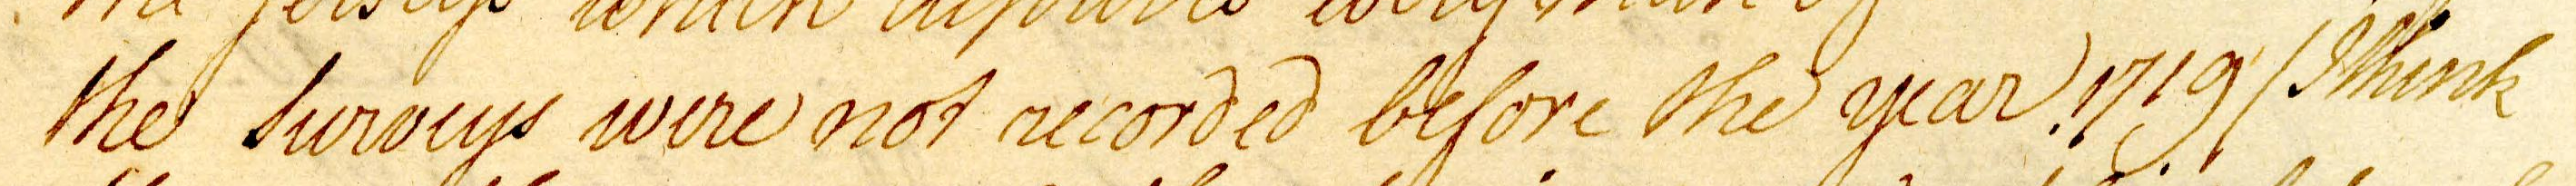the Surveys were not recorded before the year 1719 / I think
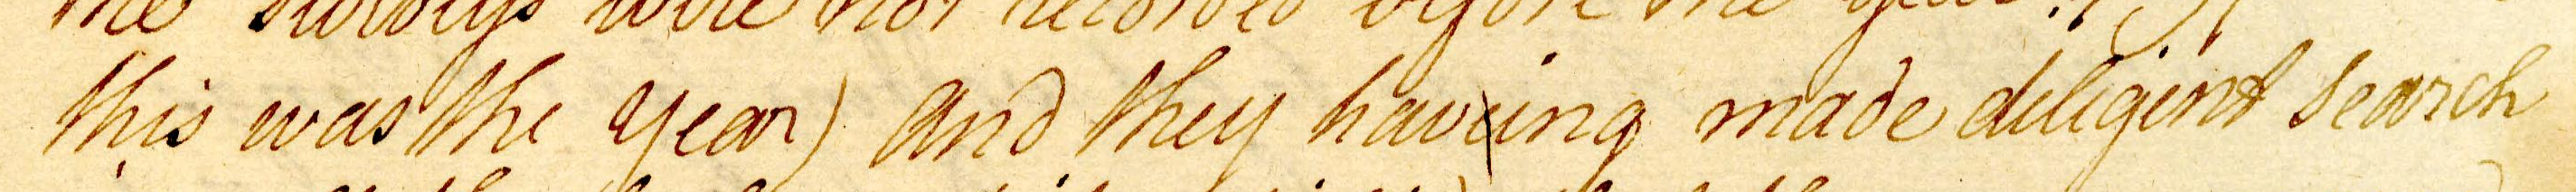this was the Year) and they having made diligent Search
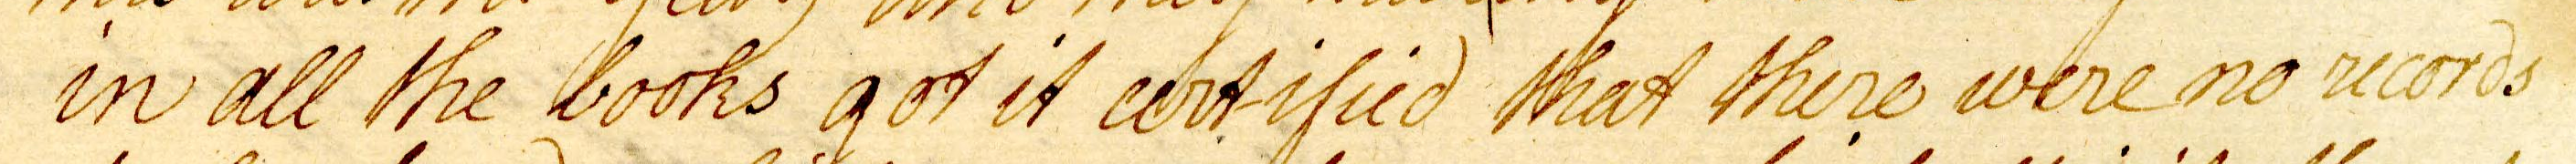in all the books got it certified that there were no records
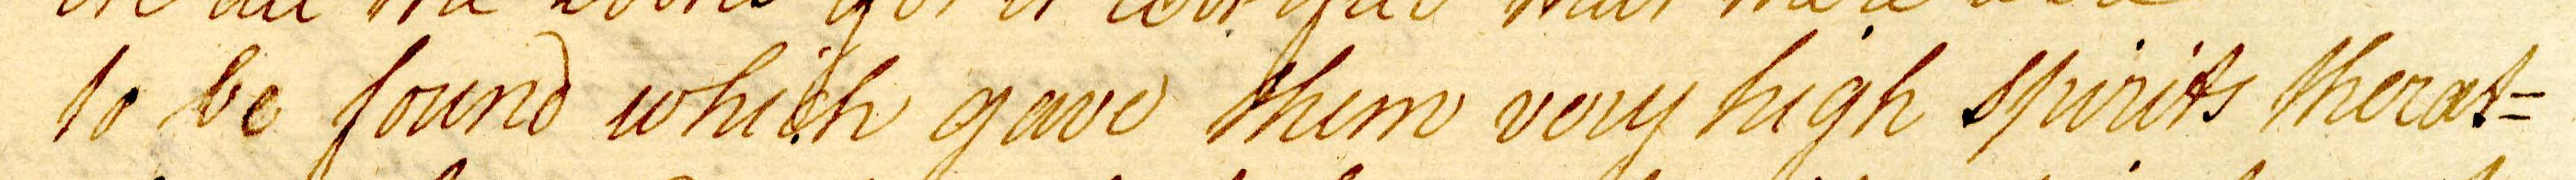to be found which gave them very high spirits therat-
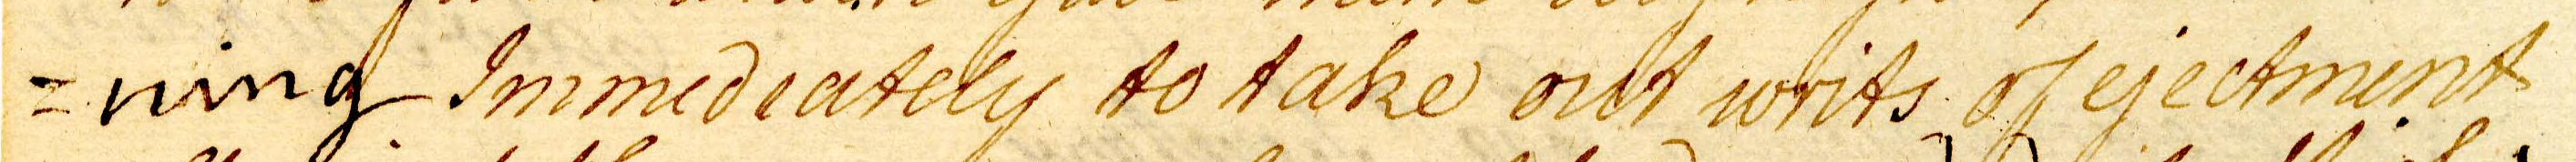-ning Immediately to take out writs of ejectment
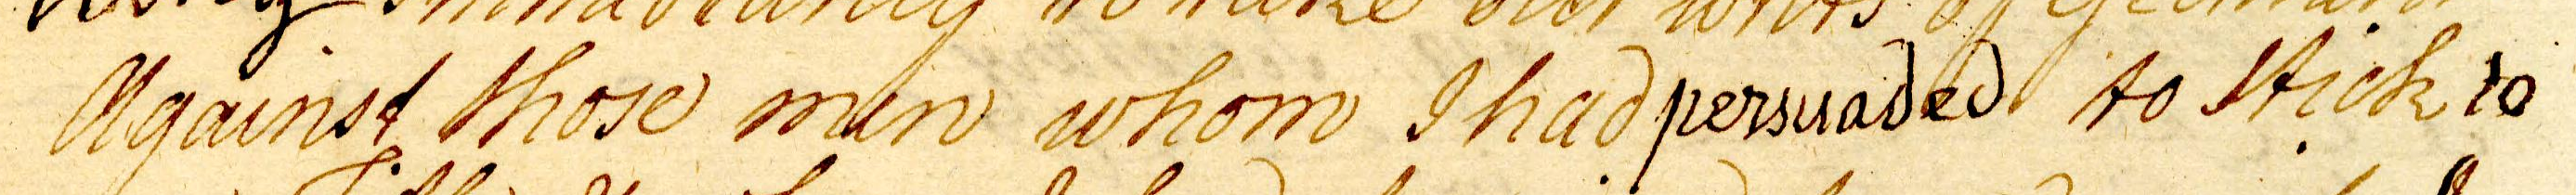Against those men whom I had persuaded to Stick to
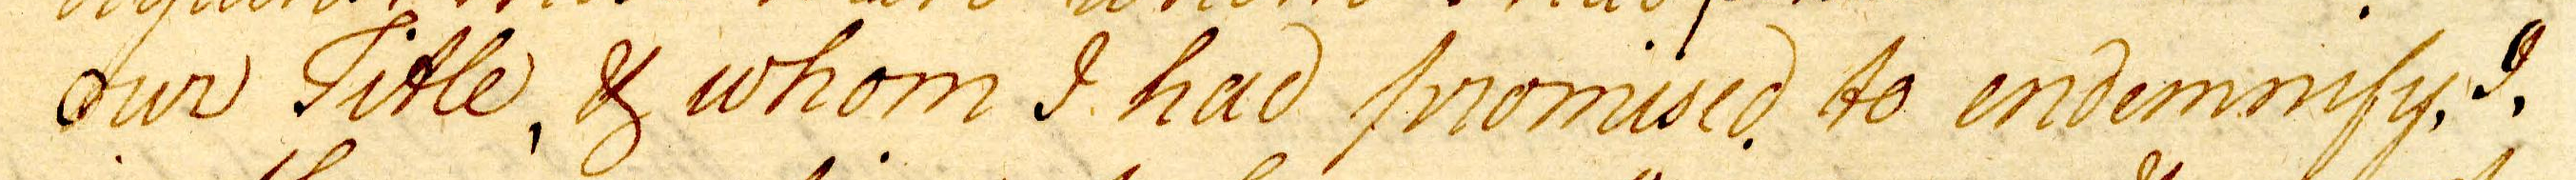our Title, & whom I had promised to endemnify, I,
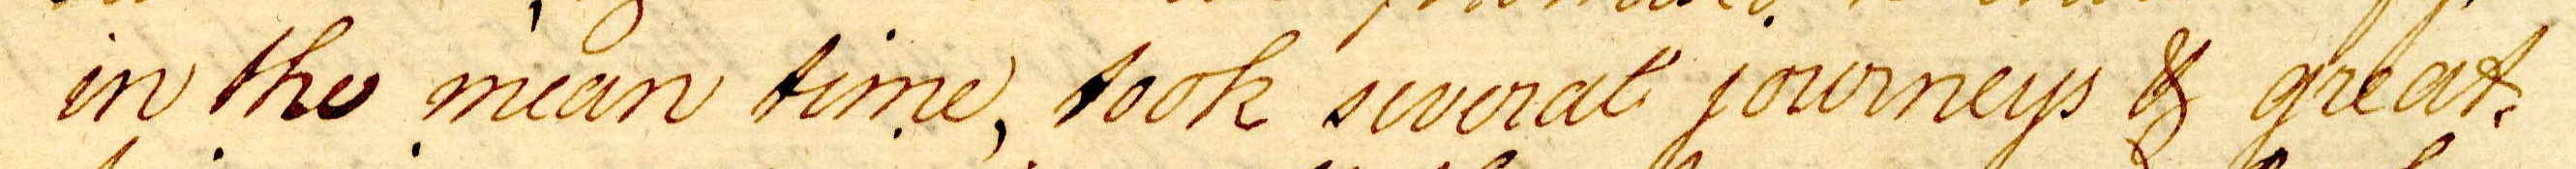in the mean time, took several journeys & great,
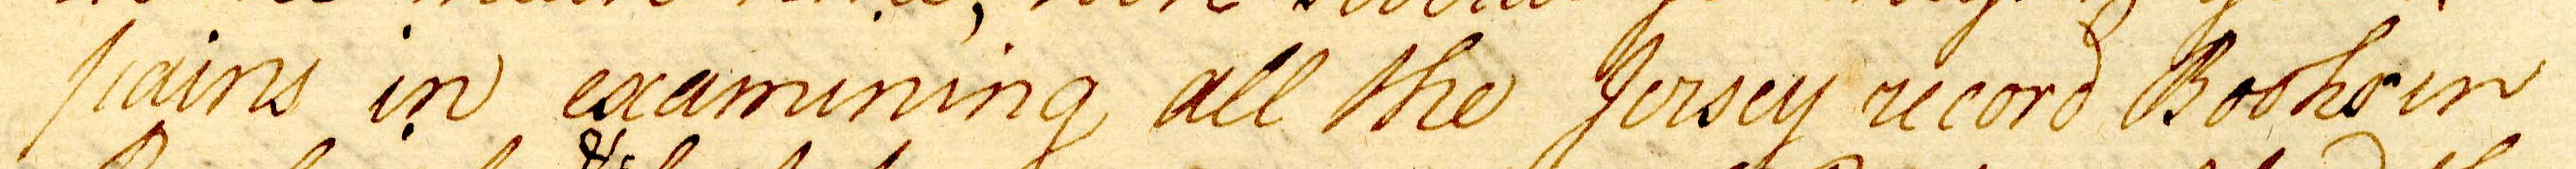Pains in examining all the Jersey record Books in
